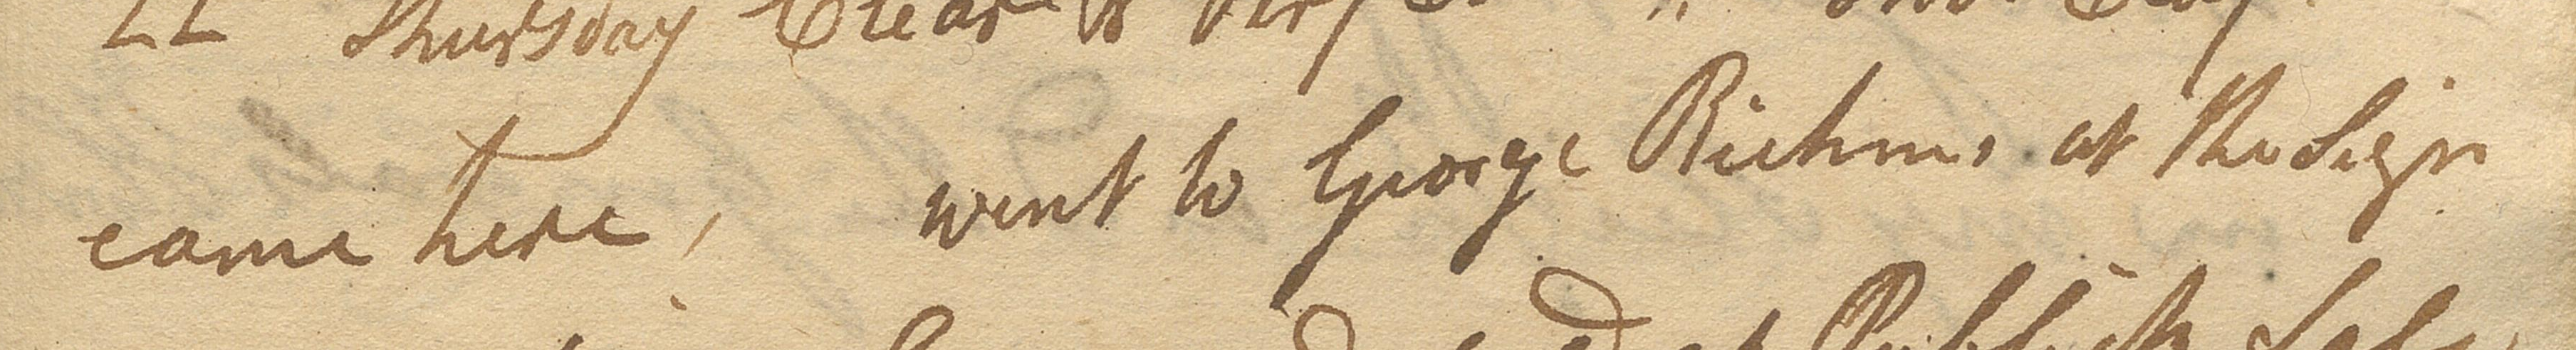came here, went to George Richms at the Sign
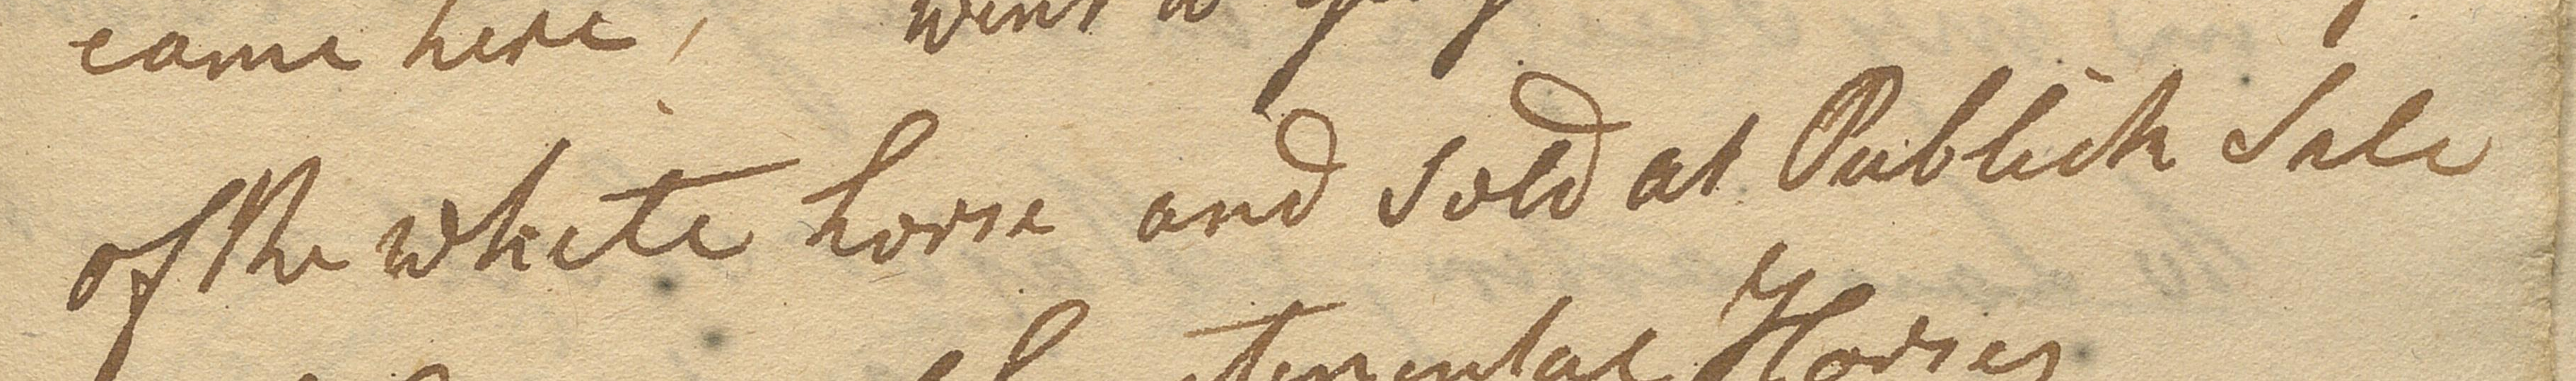of the white horse and sold at Publick Sale
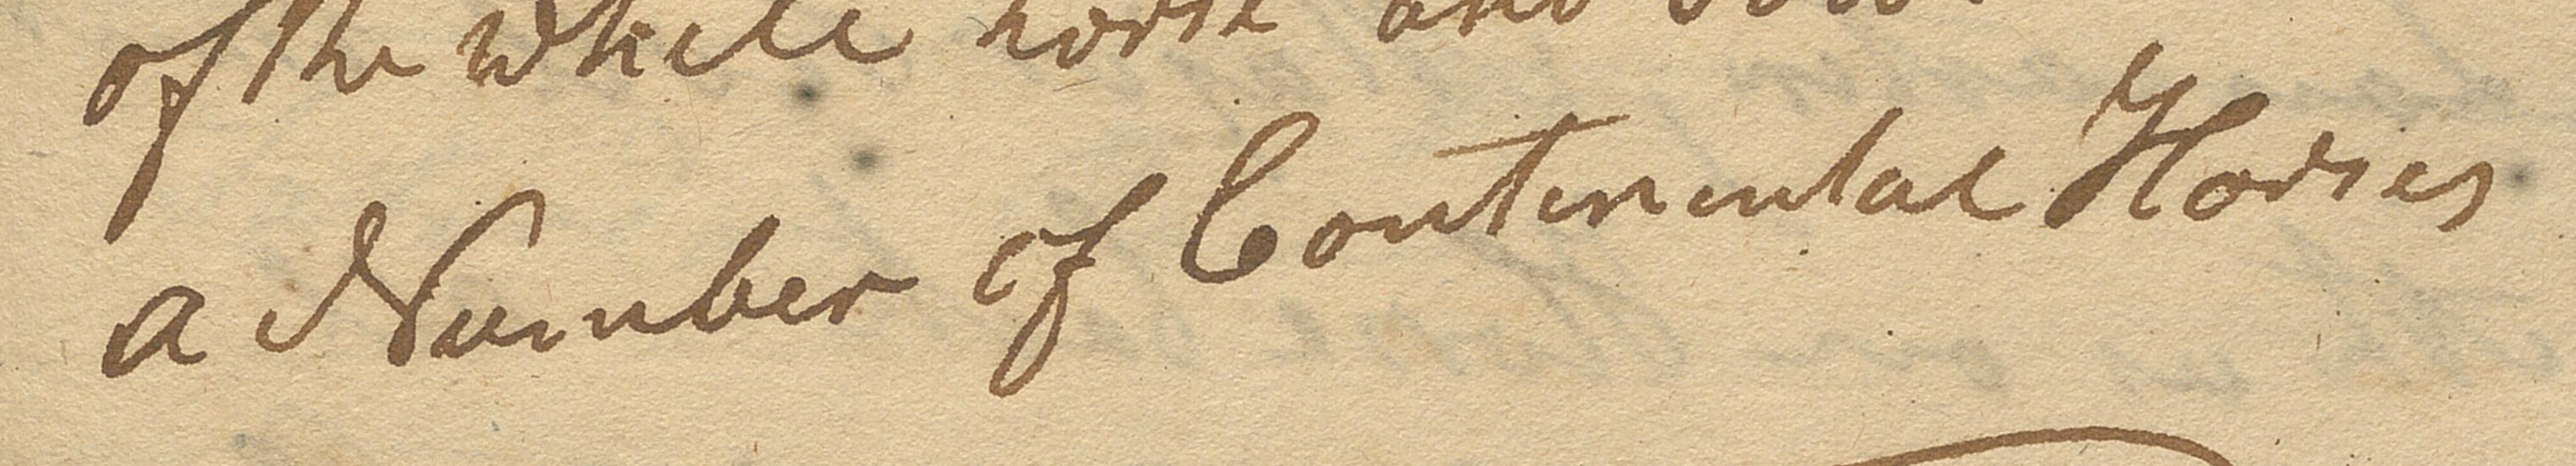a Number of Continental Horses
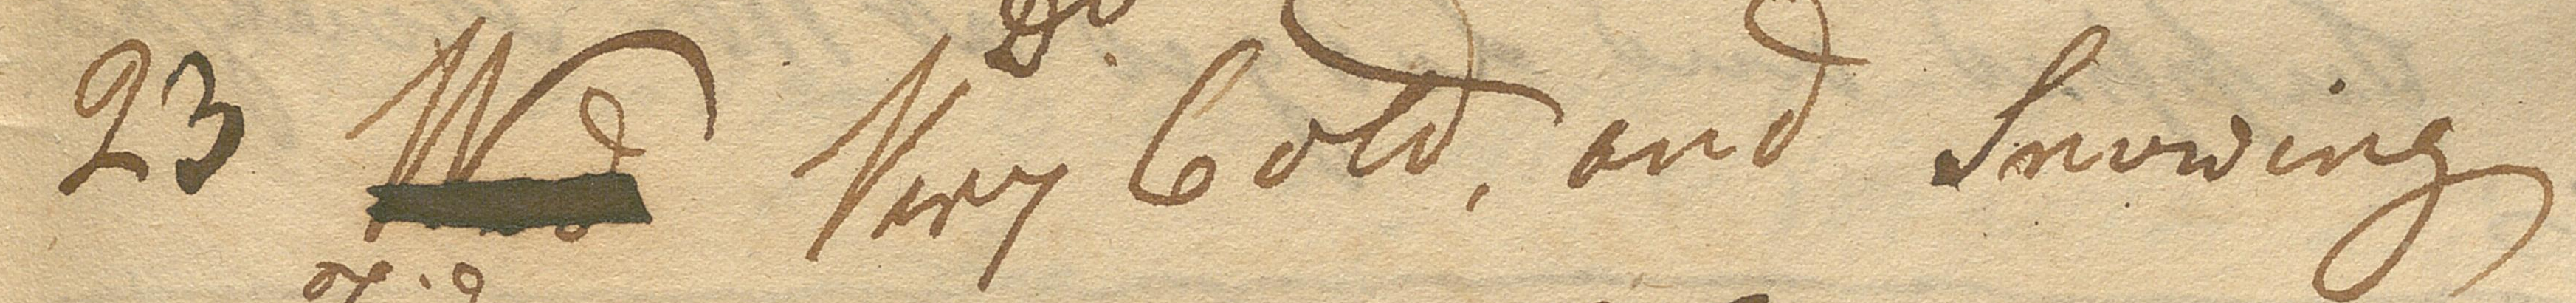23 [Wed] Very Cold, and Snowing
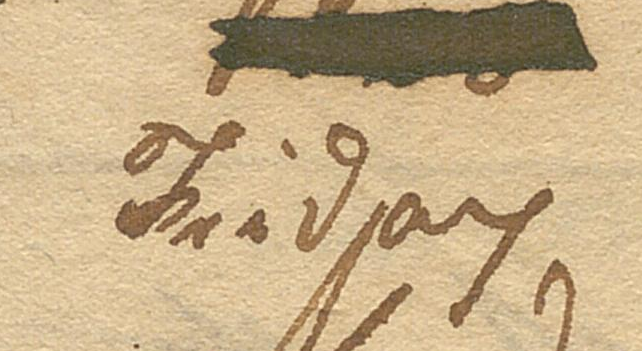Friday
